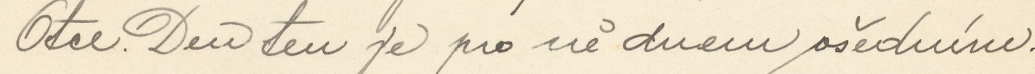Otce. Den ten je pro ně dnem všedním.
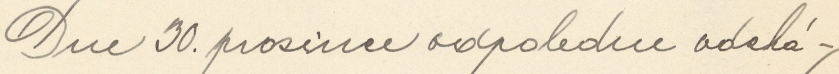Dne 30. prosince odpoledne odchá-
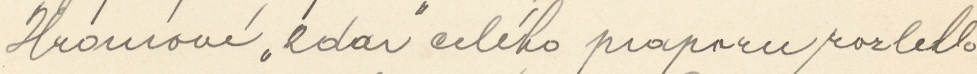Hromové „zdar“ celého praporu rozlehlo
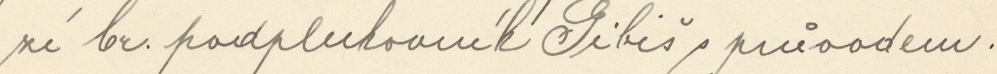zí br. podplukovník Sibiš s průvodem.
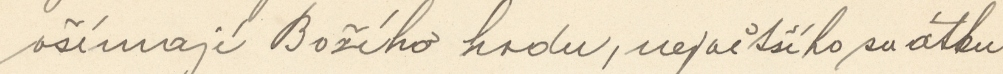všímají Božího hodu, největšího svátku
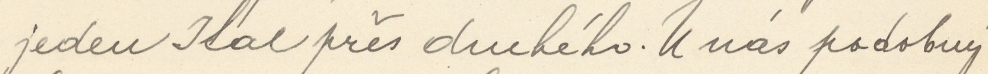jeden Ital přes druhého. U nás podobný
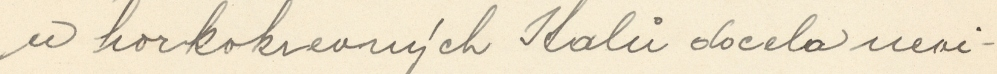u horkokrevných Italů docela nevi-
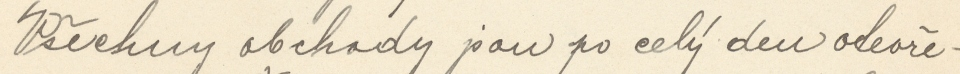Všechny obchody jsou po celý den otevře-
